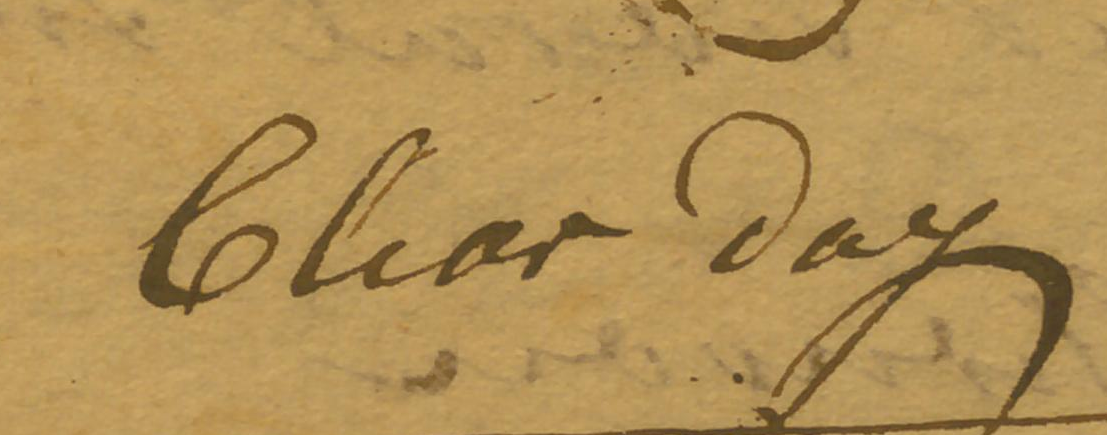Clear day
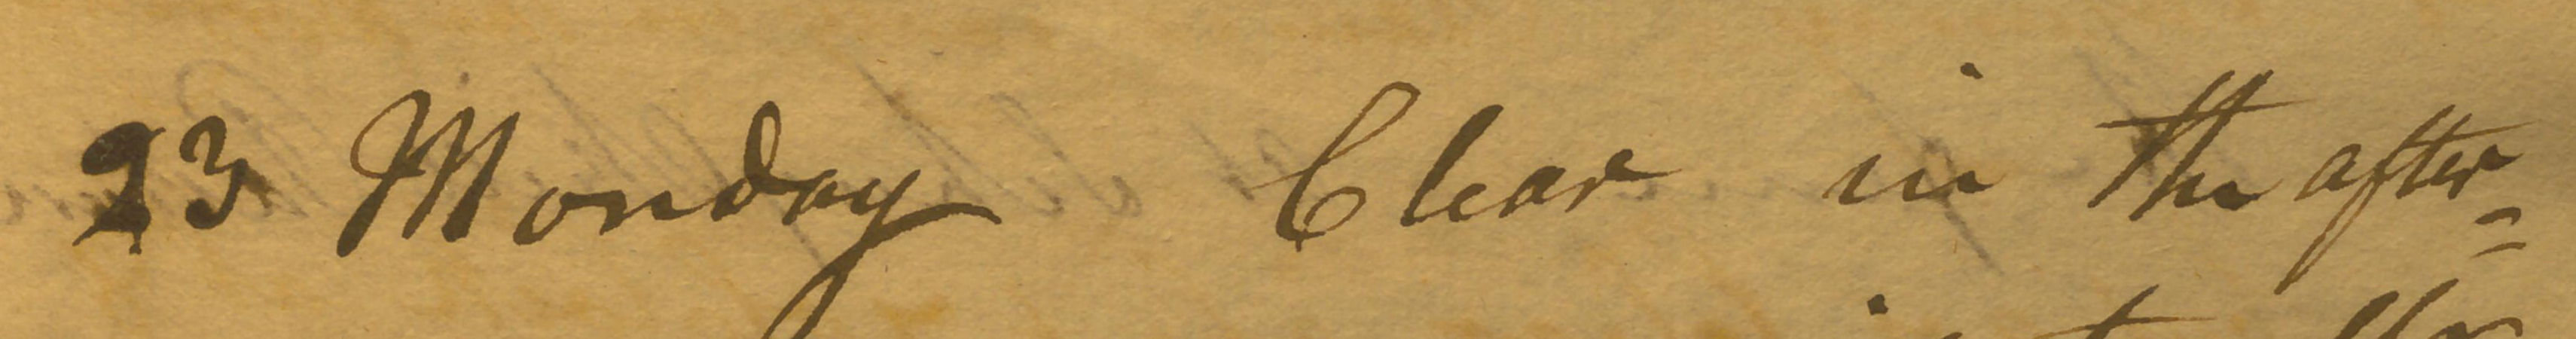23 Monday Clear in the after-
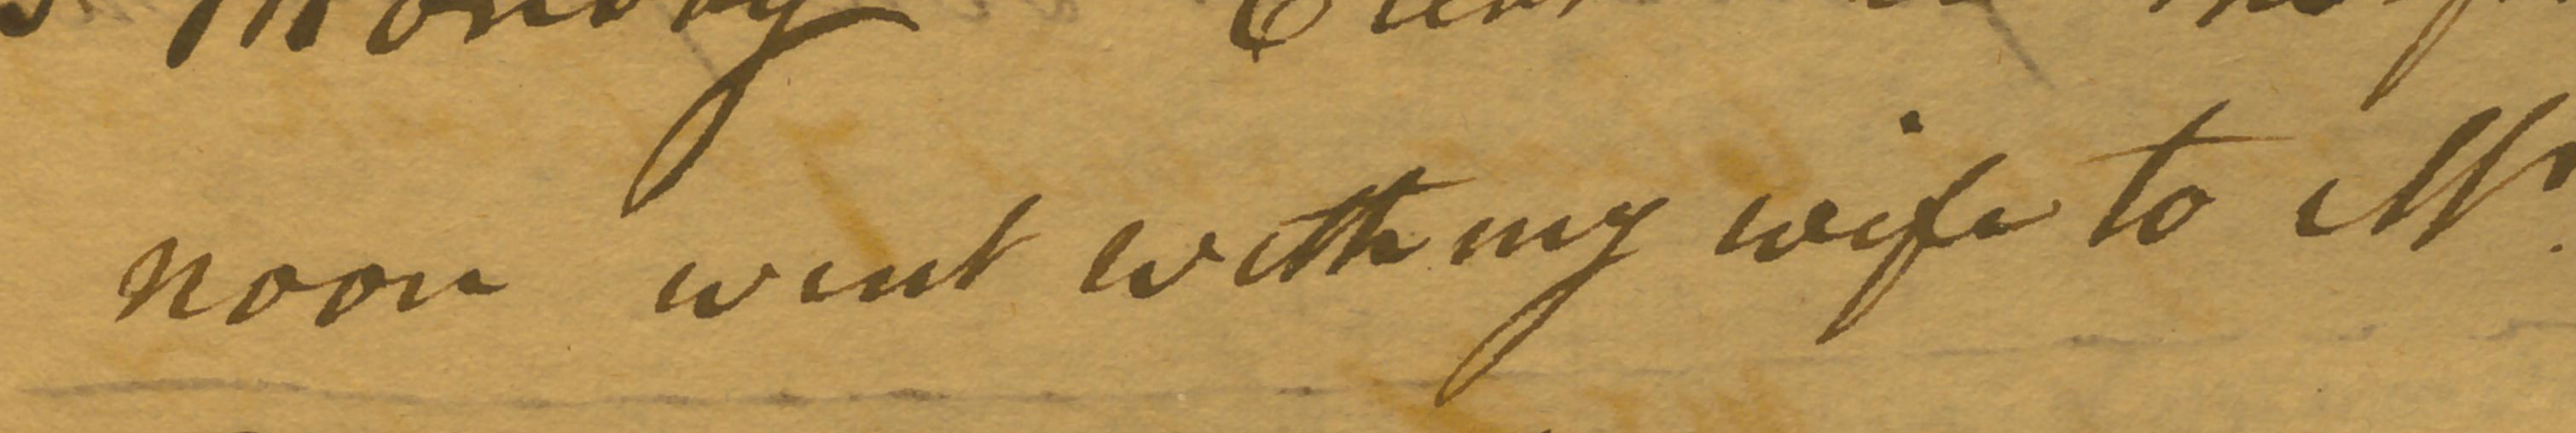noon went with my wife to M^r.
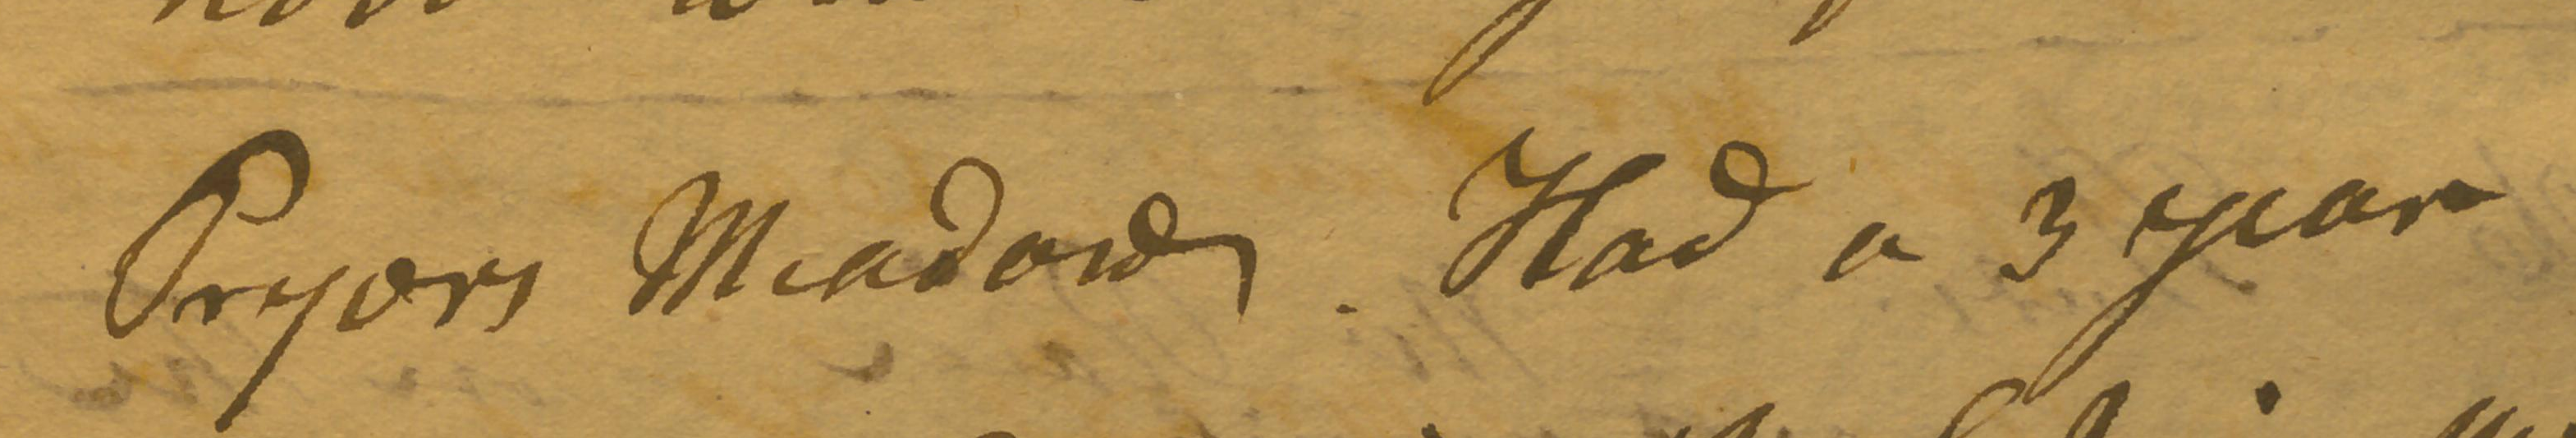Pryors Meadow Had a 3 year
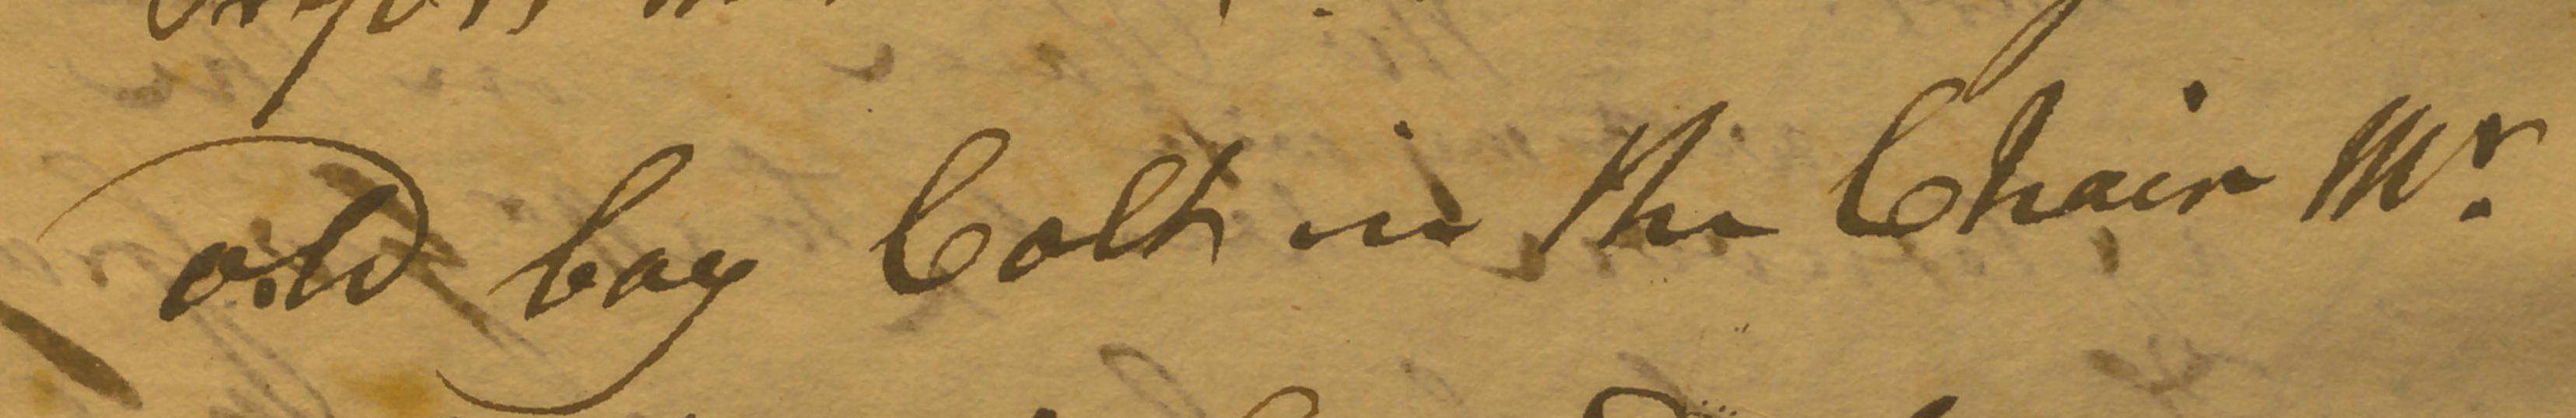oold bay Colt in the Chair M^r.
